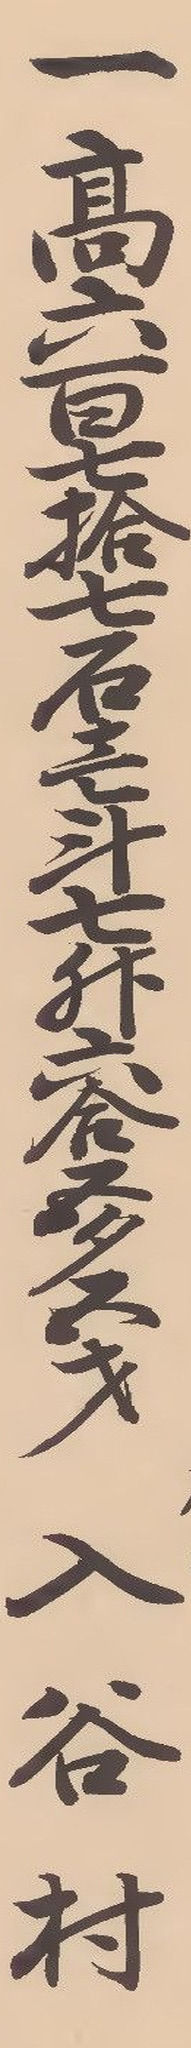一高六百七拾七石壱斗七升六合五勺五才入谷村
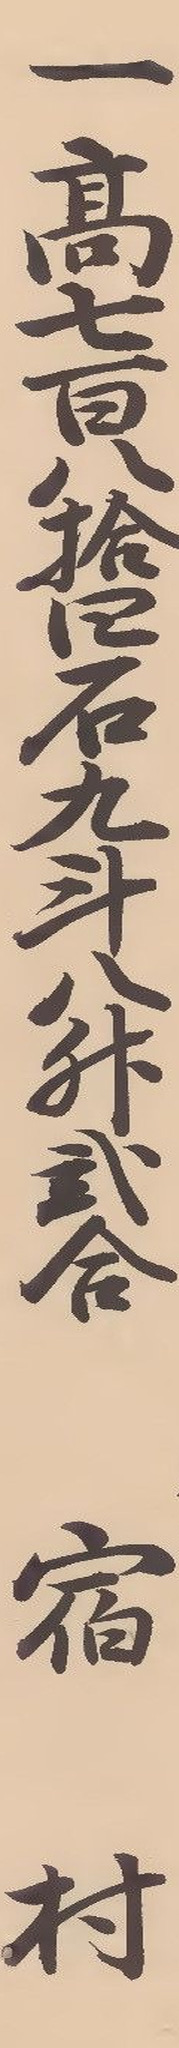一高七百八拾四石九斗八升弐合宿村
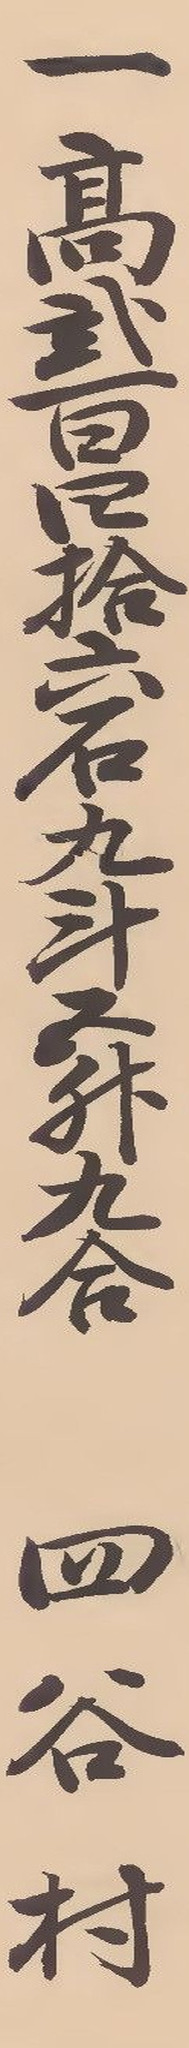一高弐百四拾六石九斗五升九合四谷村
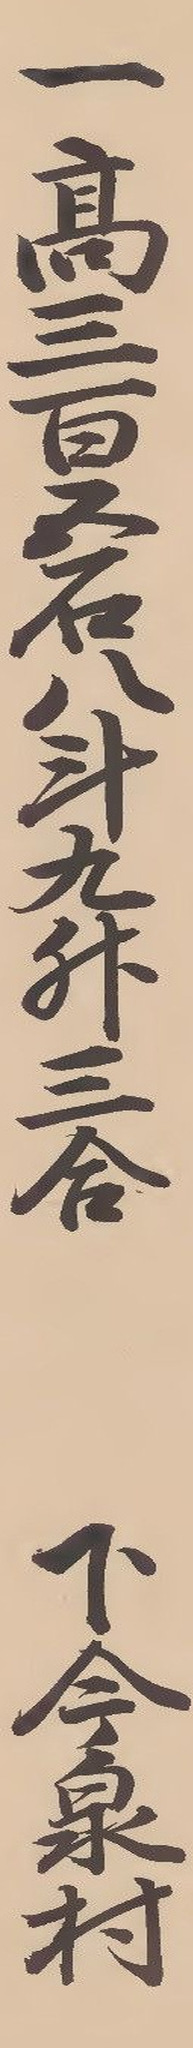一高三百五石八斗九升三合下今泉村
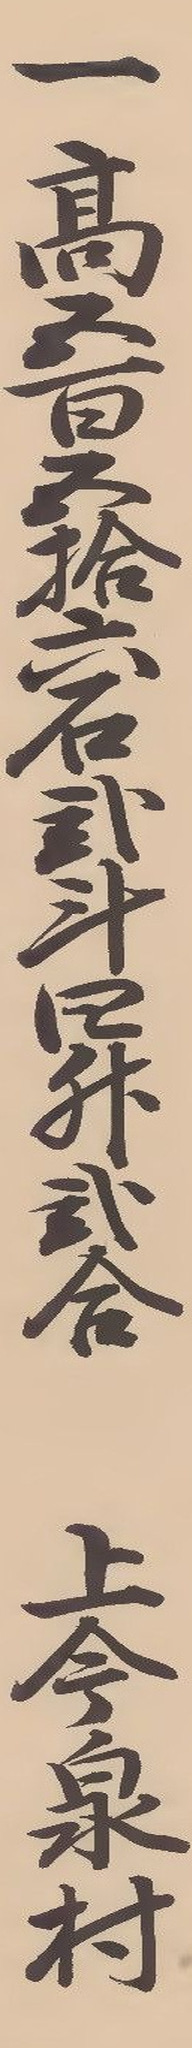一高五百五拾六石弐斗四升弐合上今泉村
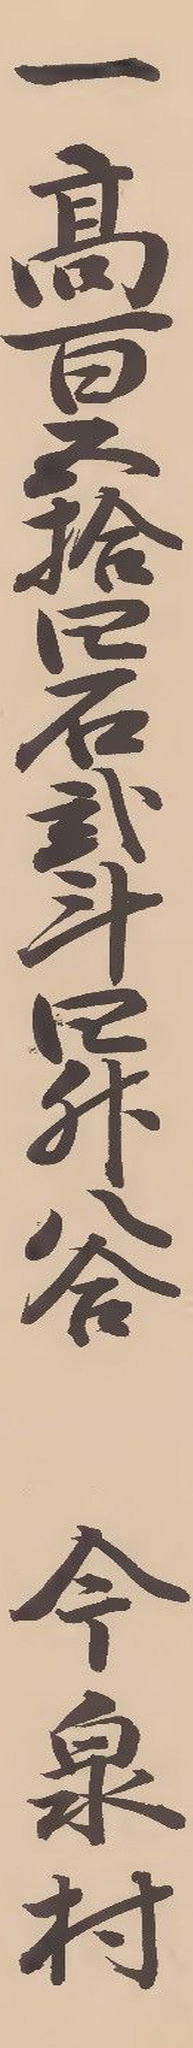一高百五拾四石弐斗四升八合今泉村
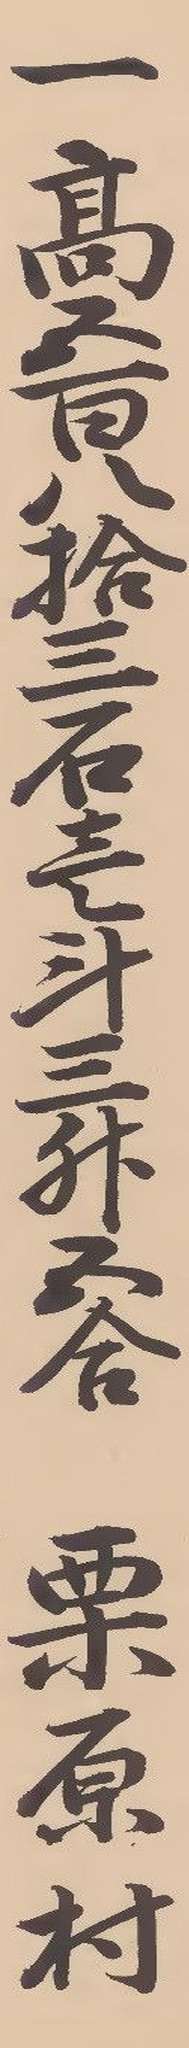一高五百八拾三石壱斗三升五合栗原村

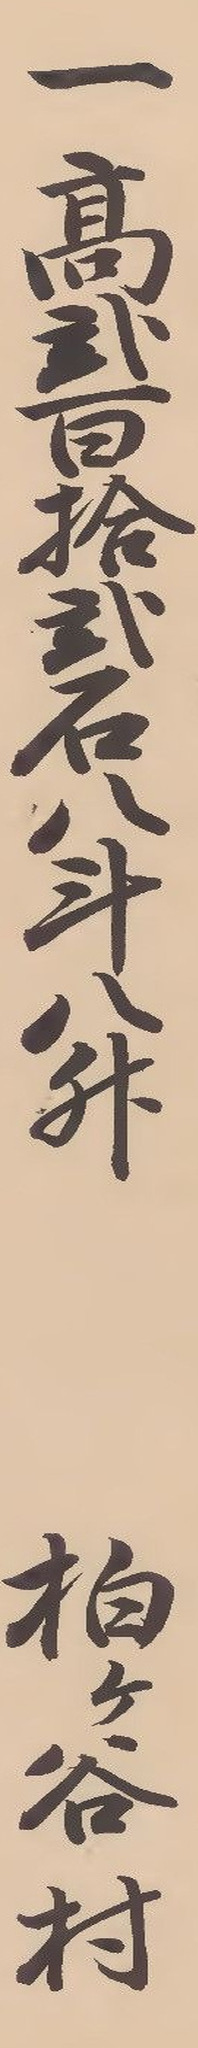一高弐百拾弐石八斗八升柏ヶ谷村
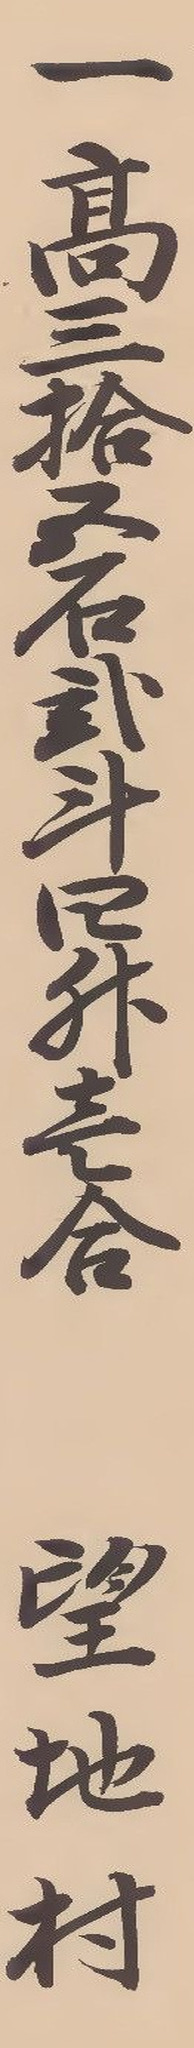一高三拾五石弐斗四升壱合望地村
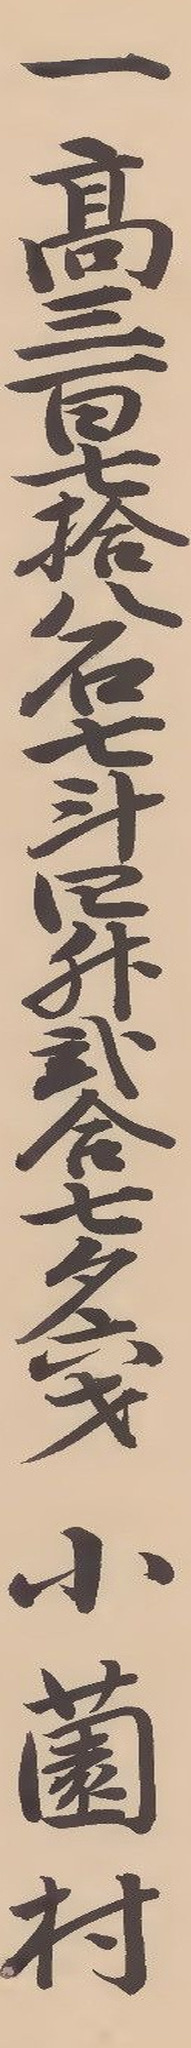一高三百七拾八石七斗四升弐合七勺六才小園村
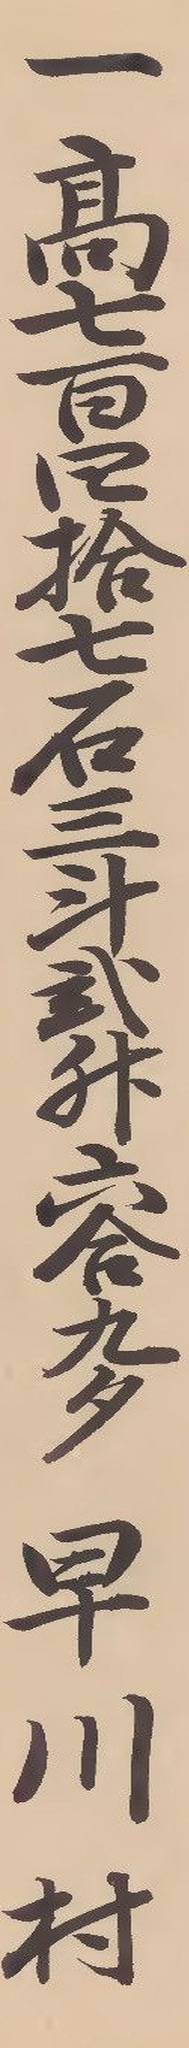一高七百四拾七石三斗弐升六合九勺早川村
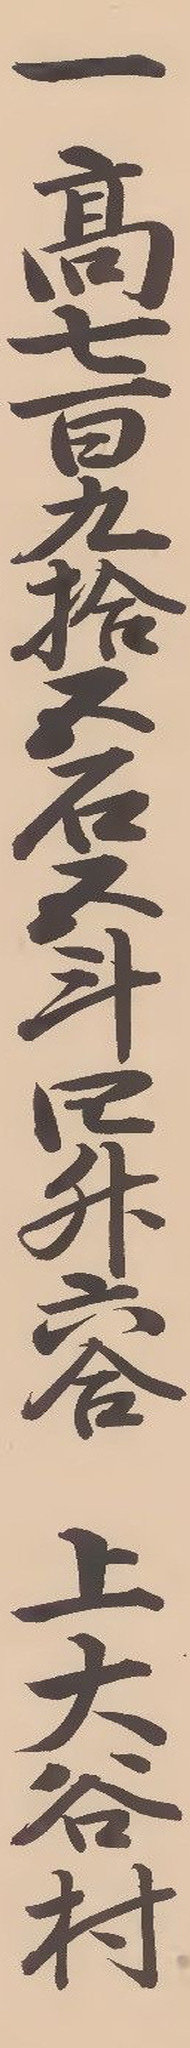一高七百九拾五石五斗四升六合上大谷村
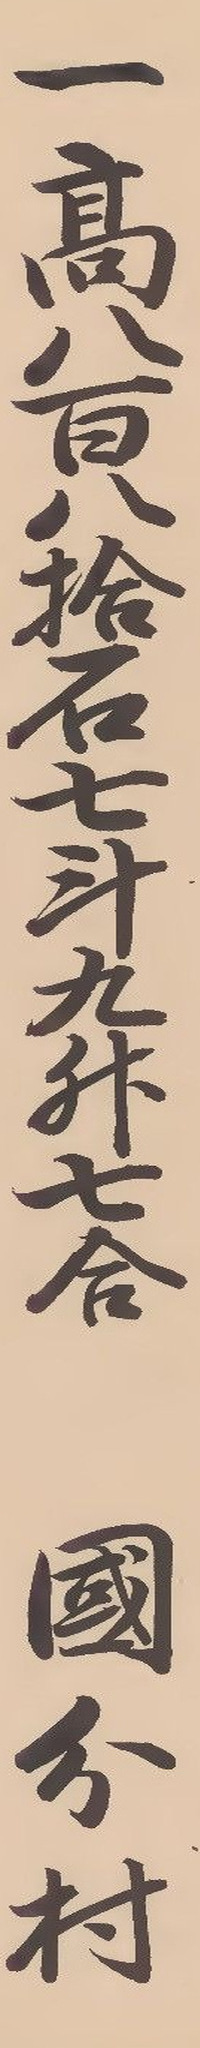一高八百八拾石七斗九升七合国分村
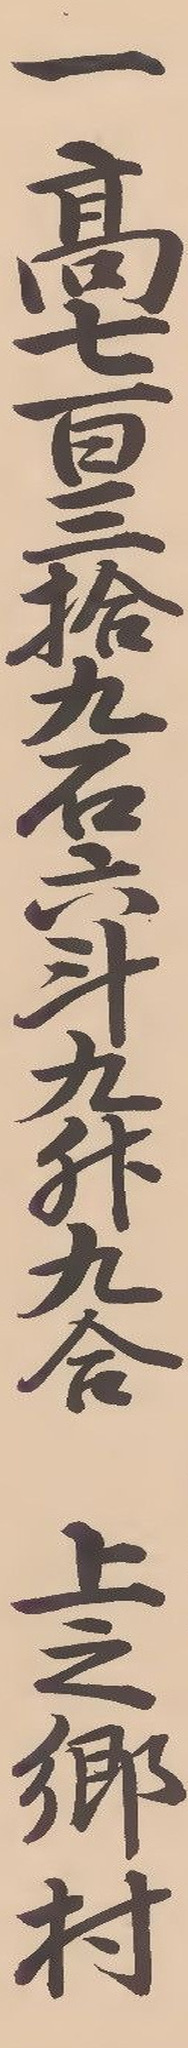一高七百三拾九石六斗九升九合上之郷村

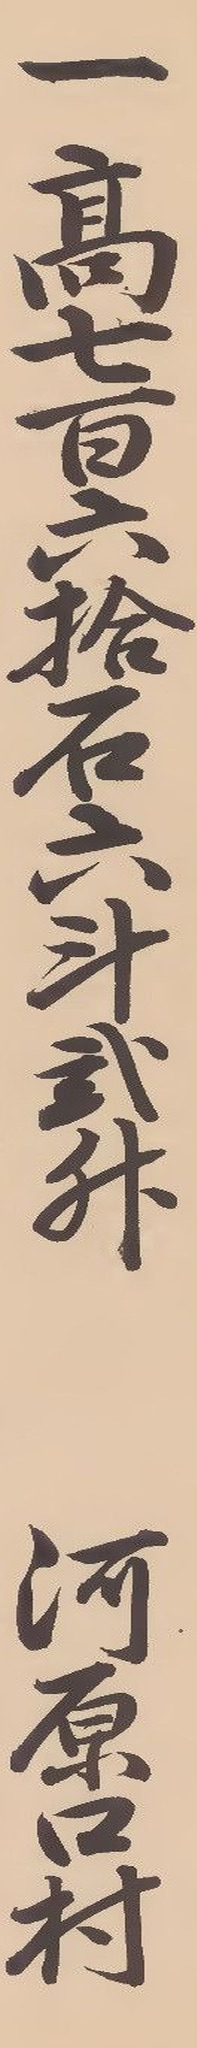一高七百六拾石六斗弐升河原口村
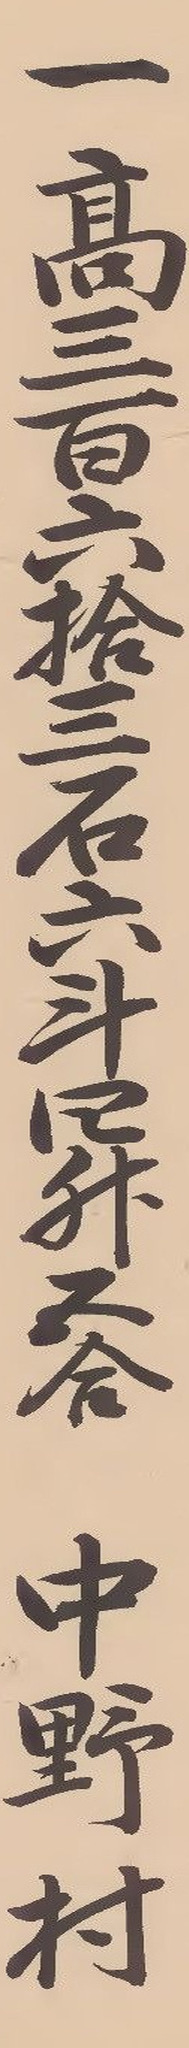一高三百六拾三石六斗四升五合中野村
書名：相模国郷帳
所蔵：国立公文書館 National Archives of Japan
